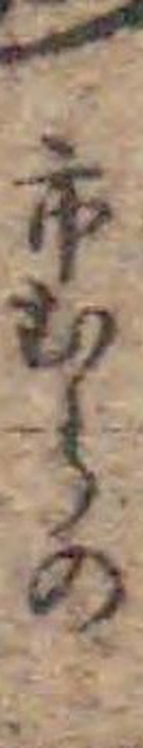市むらの
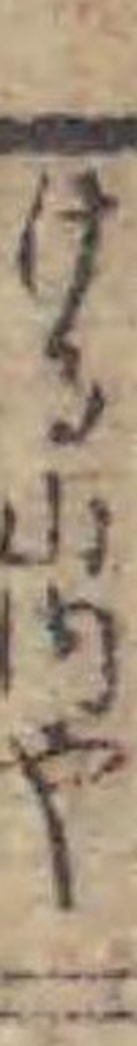ける山内や
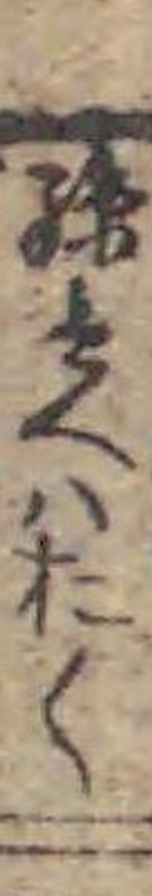孫兵衛へはおく
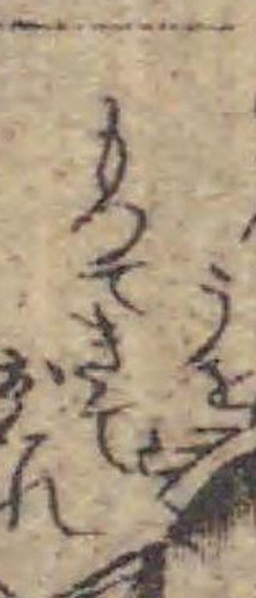もつてきて
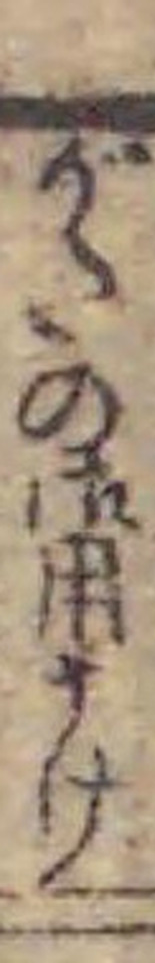がたの御用うけ
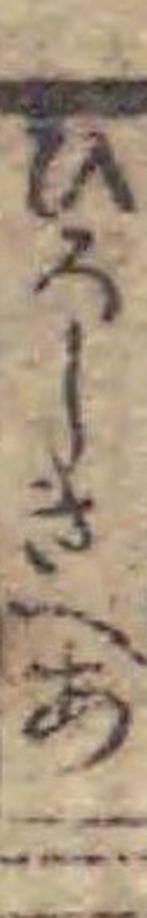ひろしきへあ
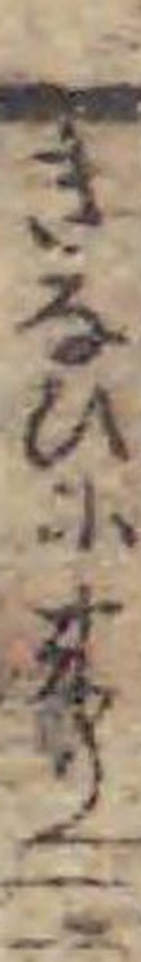きなひに来り
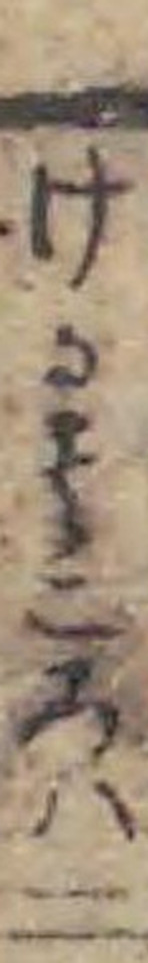ける其ころは
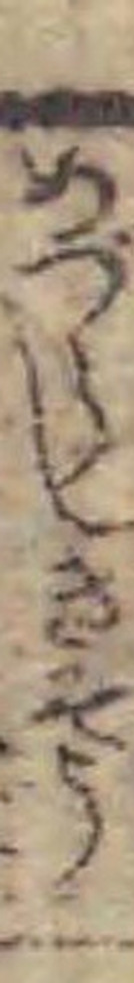めづらしきそう
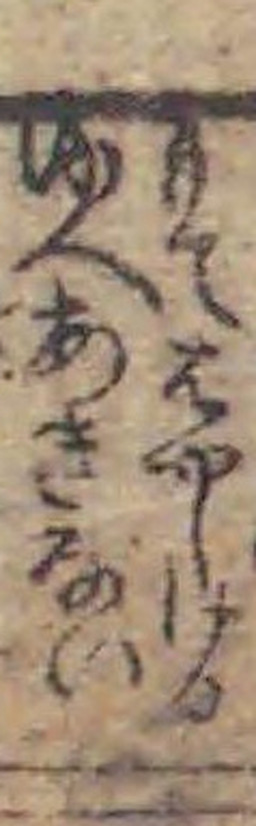ゆへあきない
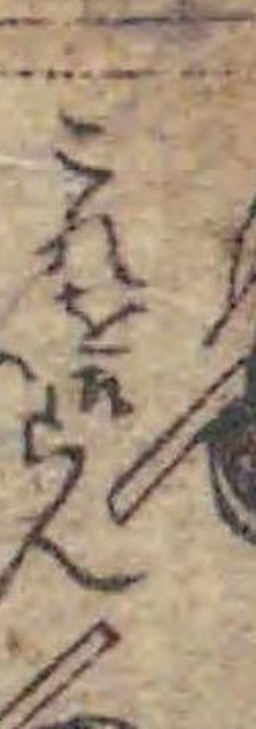これを御らん
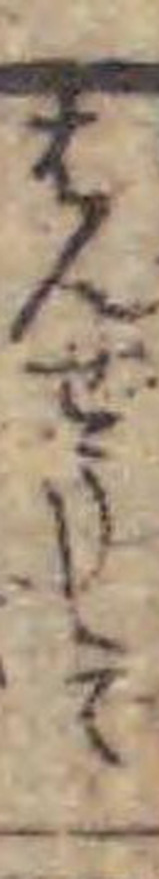はんぜうして
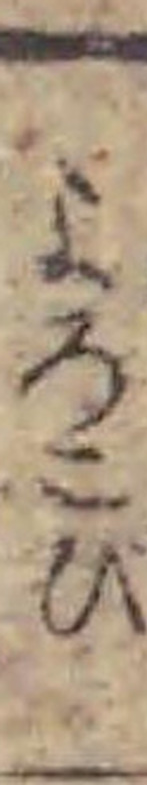よろこび

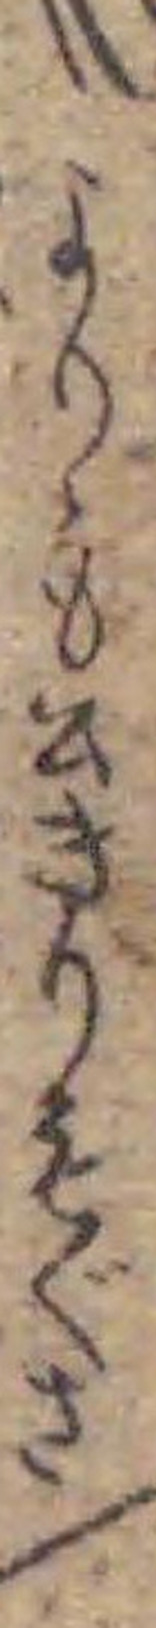よりとも公きりもぐさ
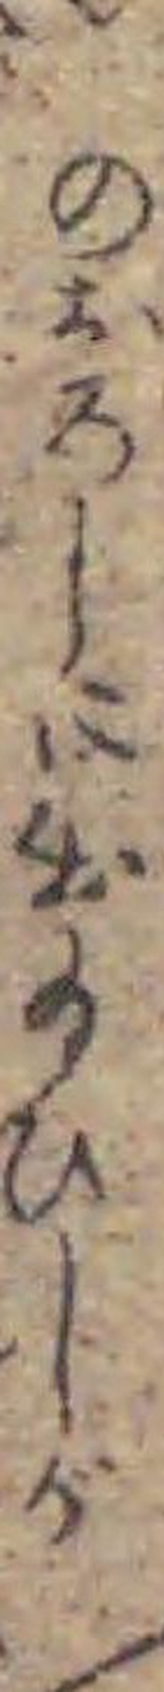のおろしに出給ひしが
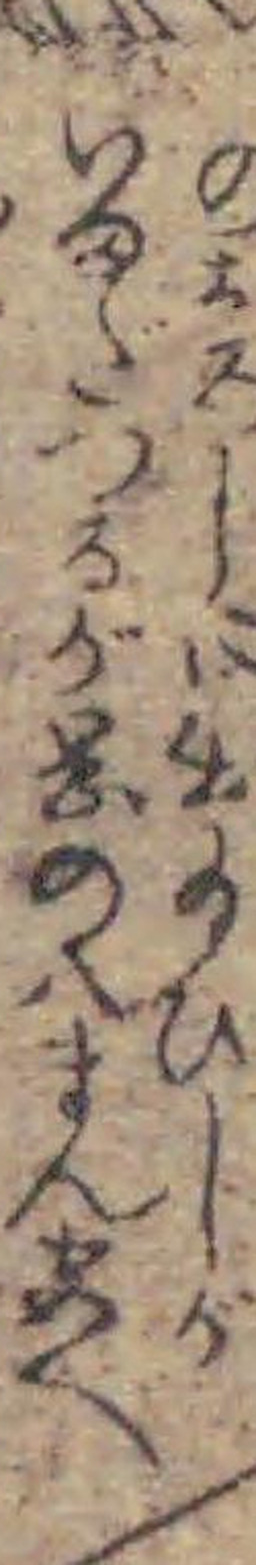いまだつるが岡の八幡宮へ
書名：三舛増鱗組 : 3巻
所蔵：国立国会図書館 National Diet Library, JAPAN
